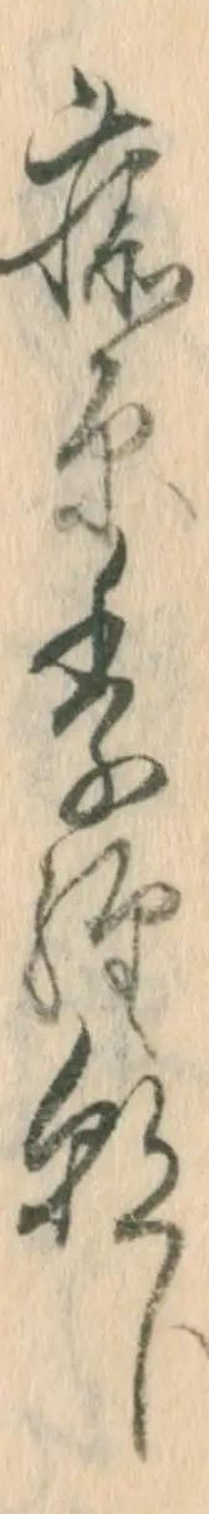藤原李経朝臣
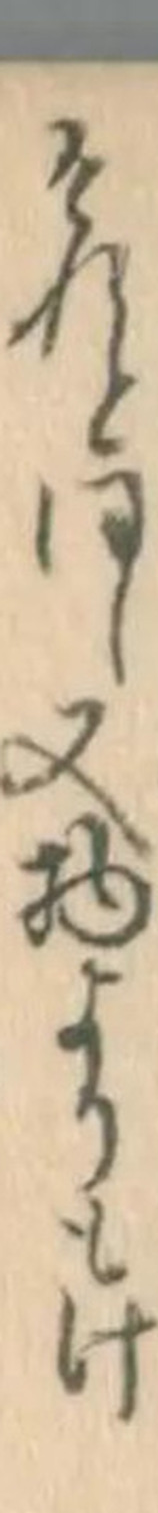それと同し又物よりもけ
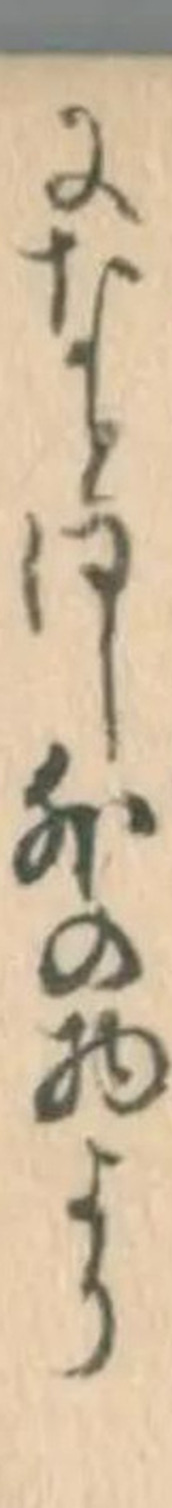になと同し外の物より
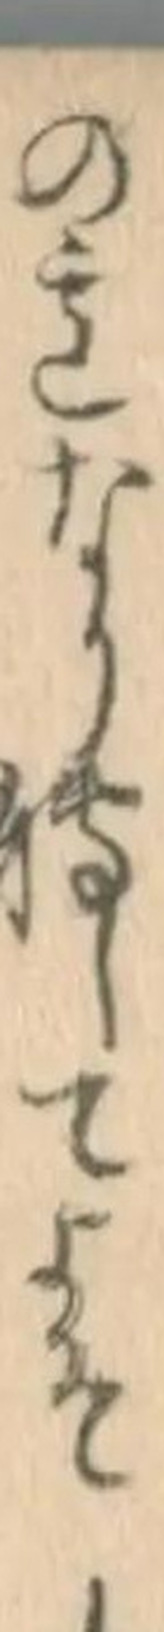の意なり転してよそ
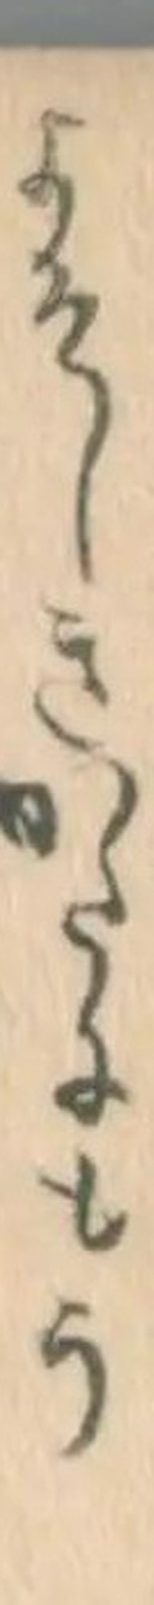よそしきかたにもう
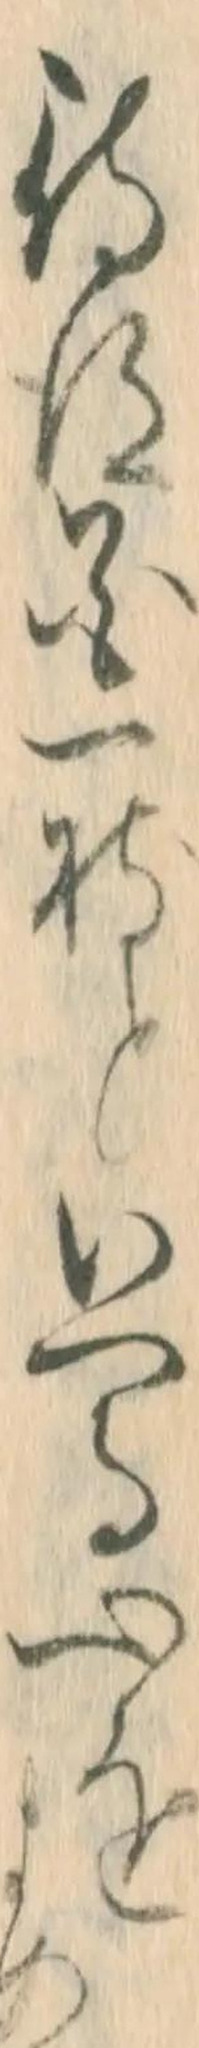待得花一枝といへる心を

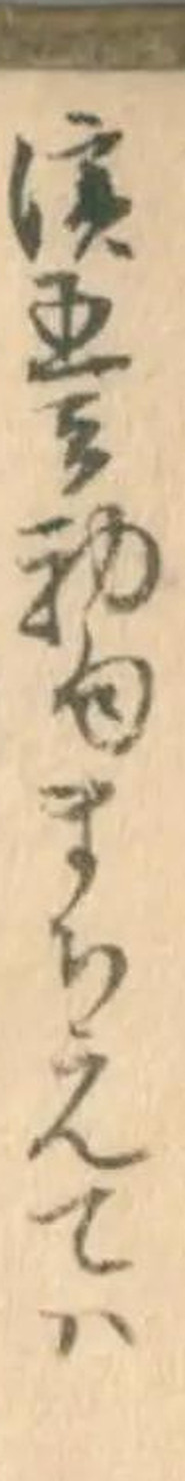浜臣云初句まちえては
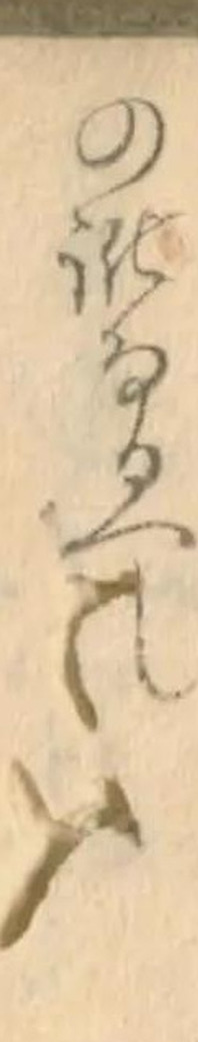の訛なるへし
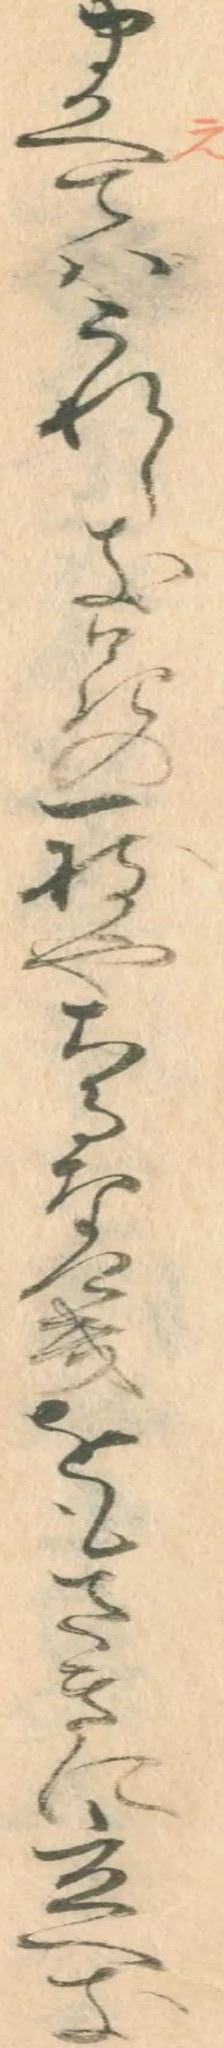まかへてはうれしき花の一枝やちるなけきをもさきに立へき
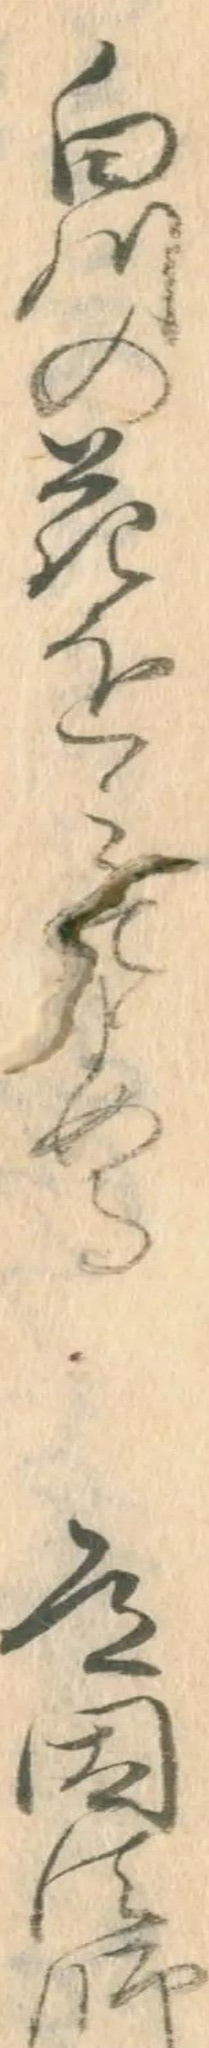白川の花をみてよめる道因法師
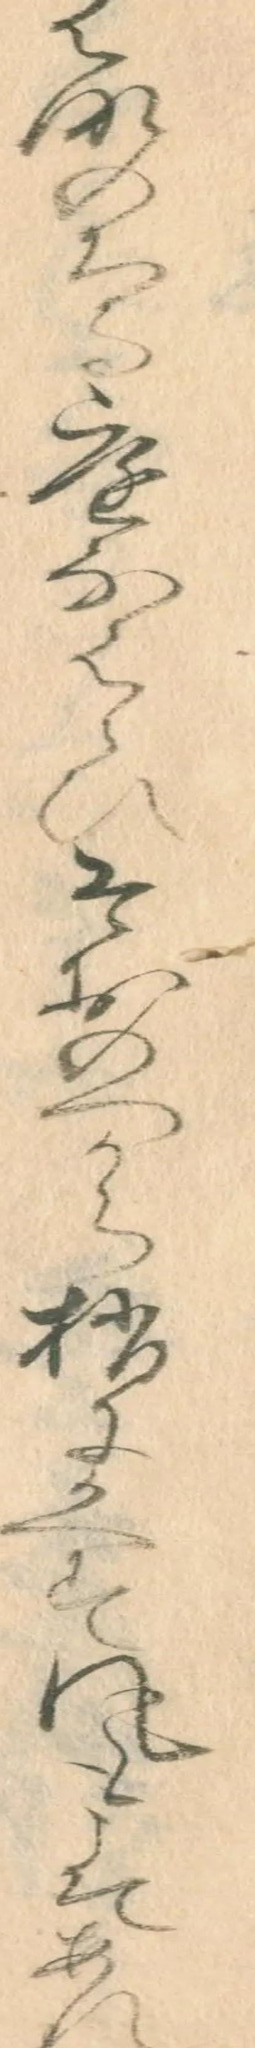はなのちる庭なはらひそおのつから梢にかへす風もこそあれ
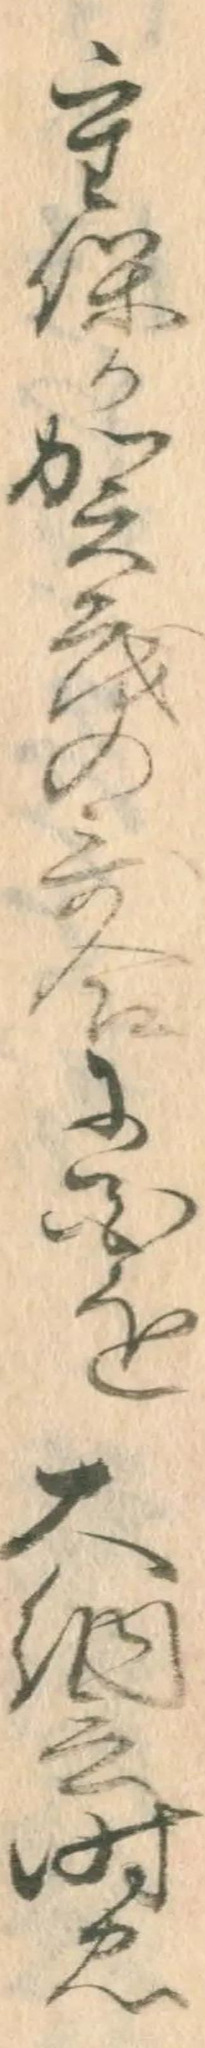重保か賀茂の歌合に花を大納言時忠
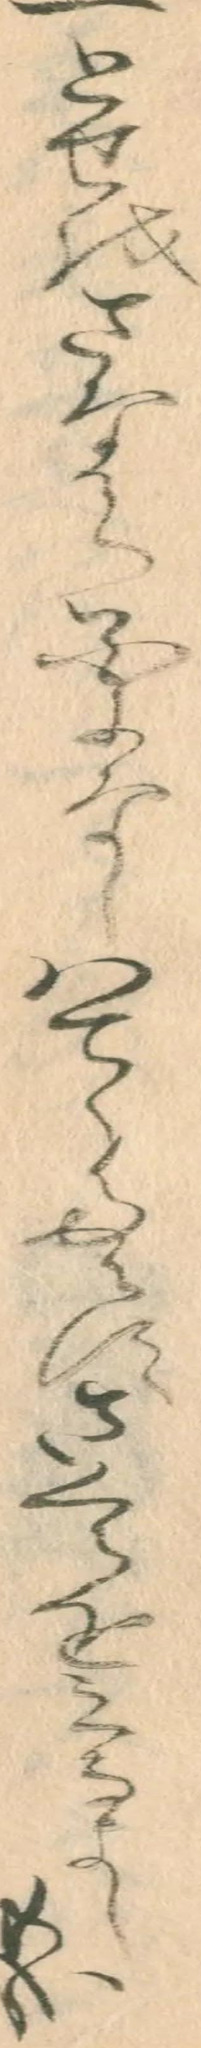一とせをさなから花になしはてゝたえすさくらをみるよしも哉
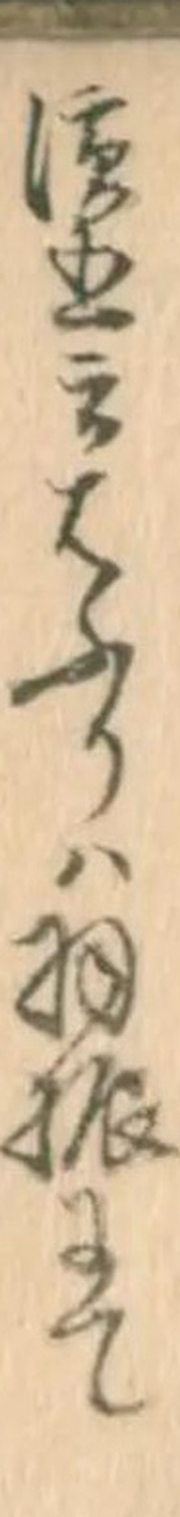浜臣云はふりは羽振にて
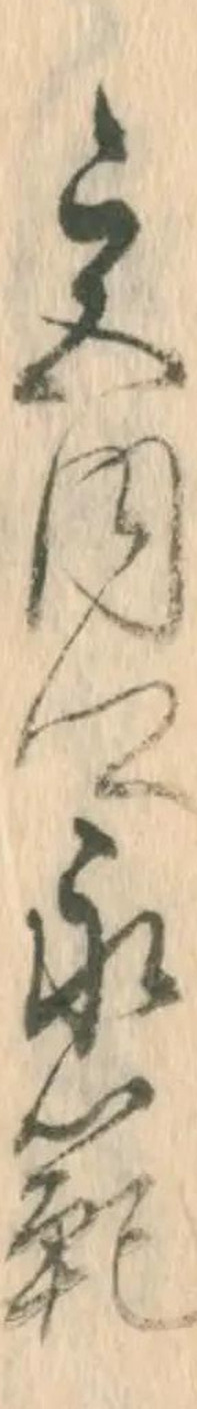宮内卿永範
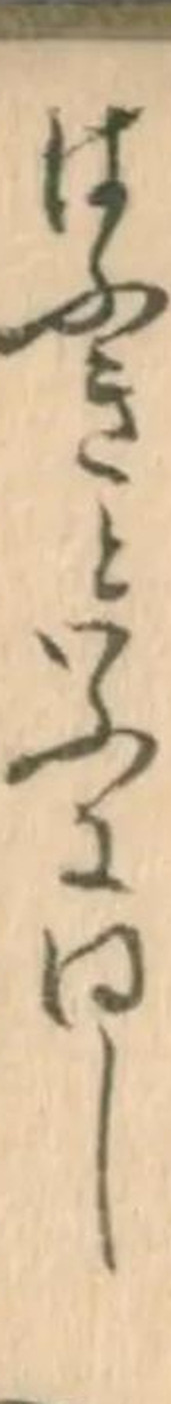はふきといふに同し
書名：月詣和歌集
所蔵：国立国会図書館 National Diet Library, JAPAN
